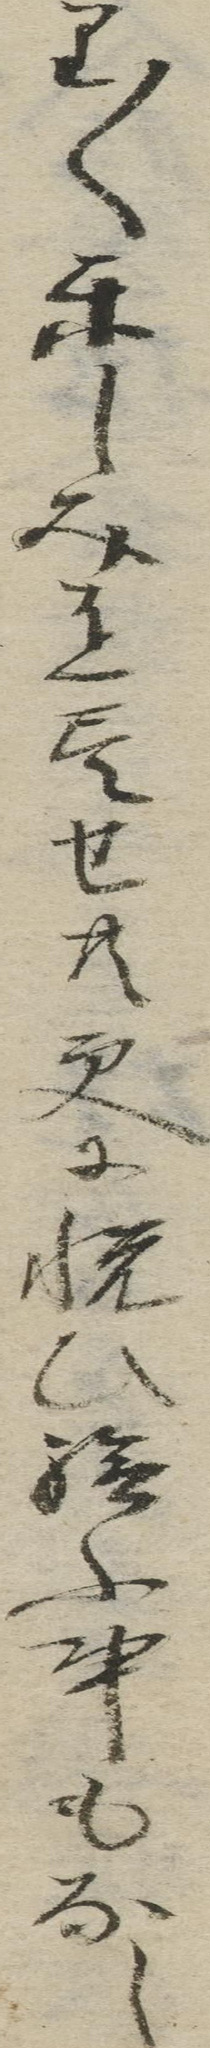わ？〳〵楽しみを尽せ共更に悦ひ給ふ事もなし
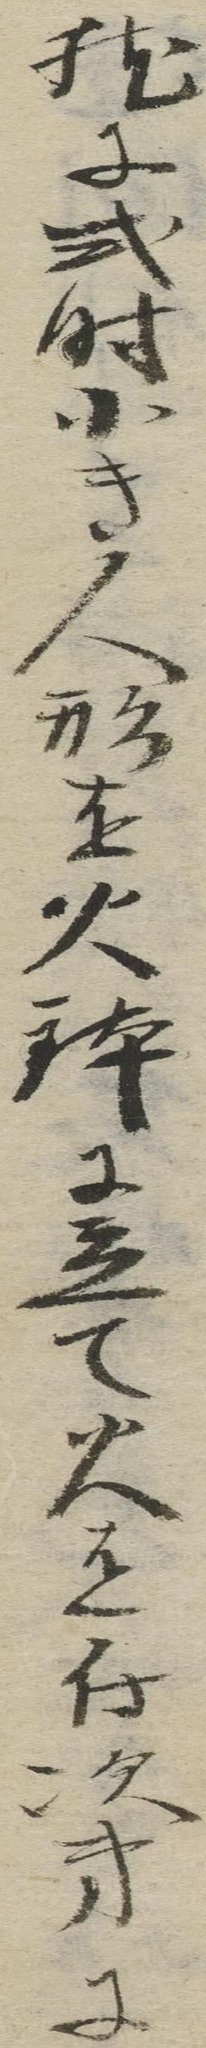然に或時小き人形を火鉢に立て火を付次第に

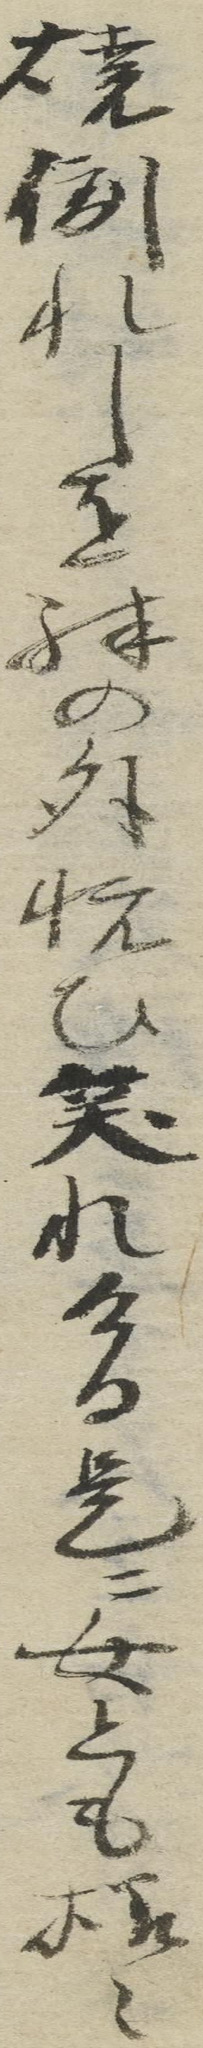焼倒れしを殊の外悦ひ笑れける是ニ女とも様〻
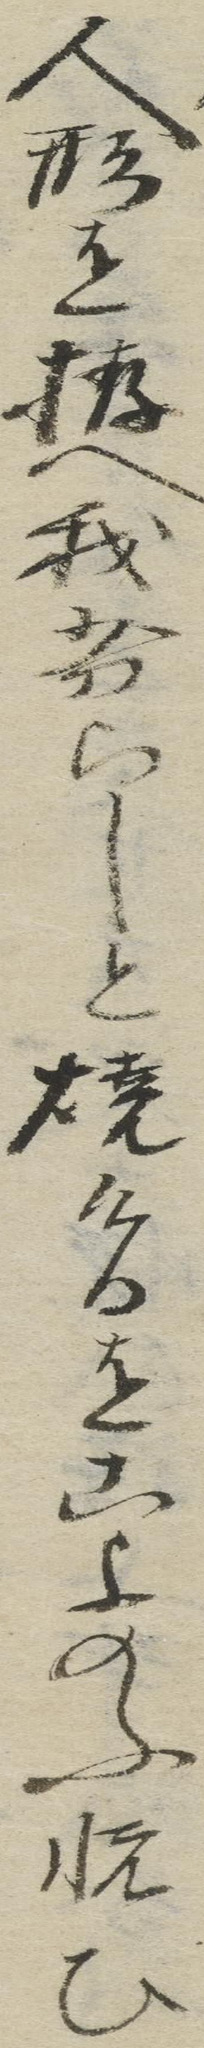人形を拵へ我劣らしと焼けるをこよのふ悦ひ
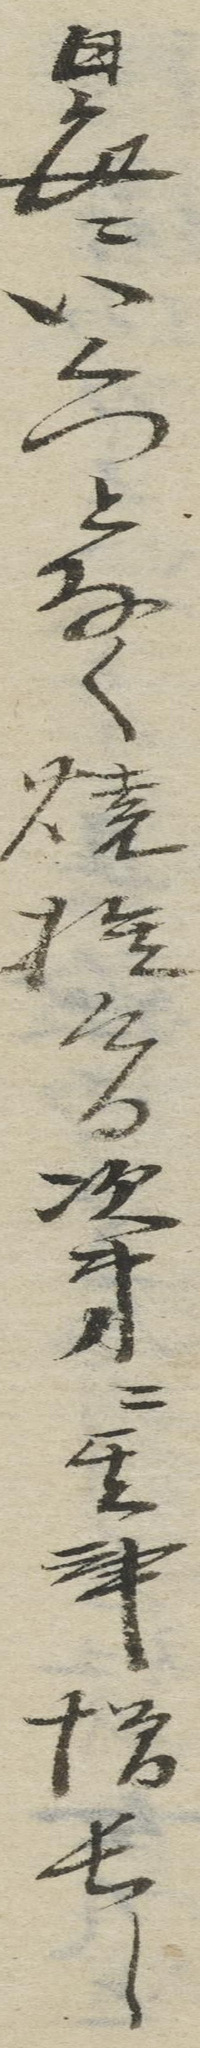日毎ニいくつとなく焼捨ける次第ニ其事増長し
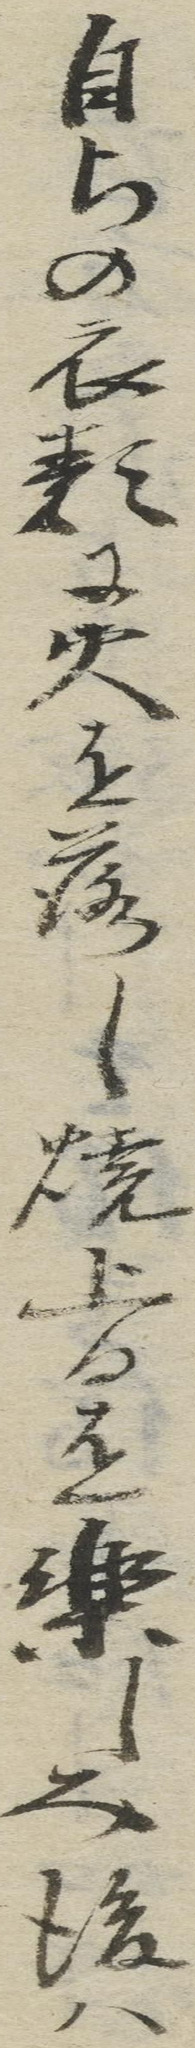自らの衣類に火を落し焼上るを楽しみ後ハ
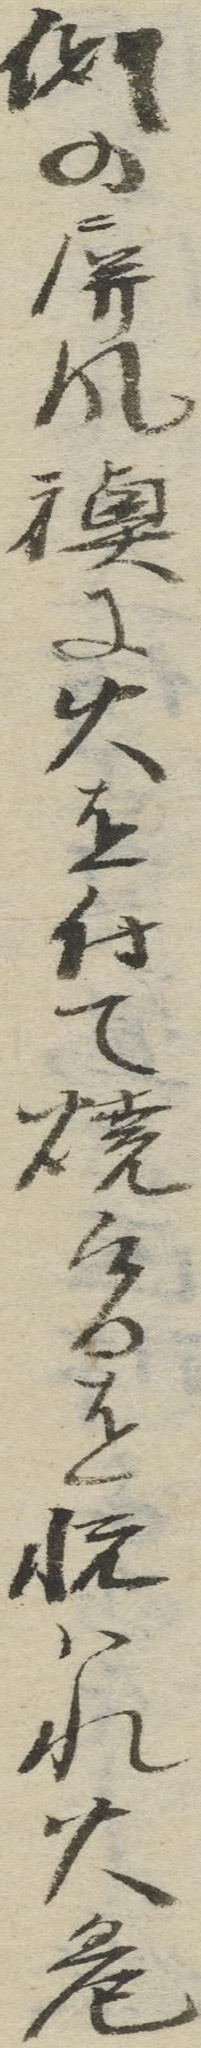側の屏風襖に火を付て焼けるを悦ハれ火危
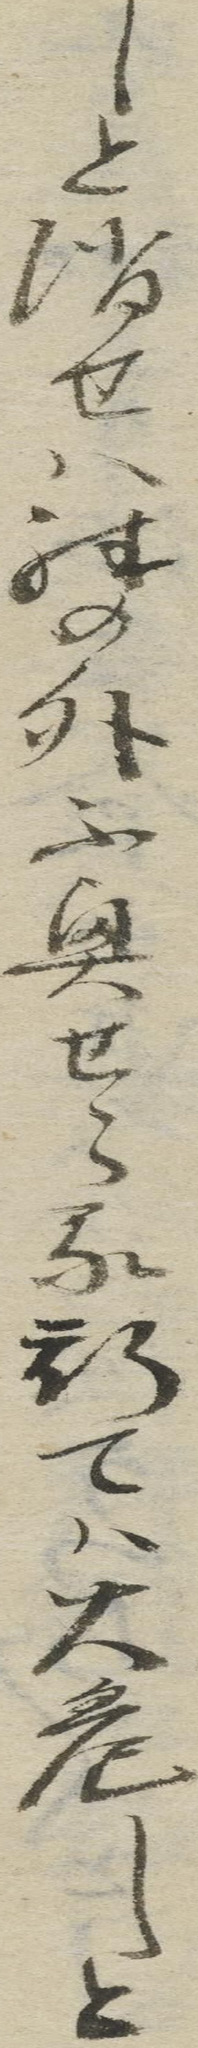しと消せハ殊の外不興せらる斯てハ火危しと
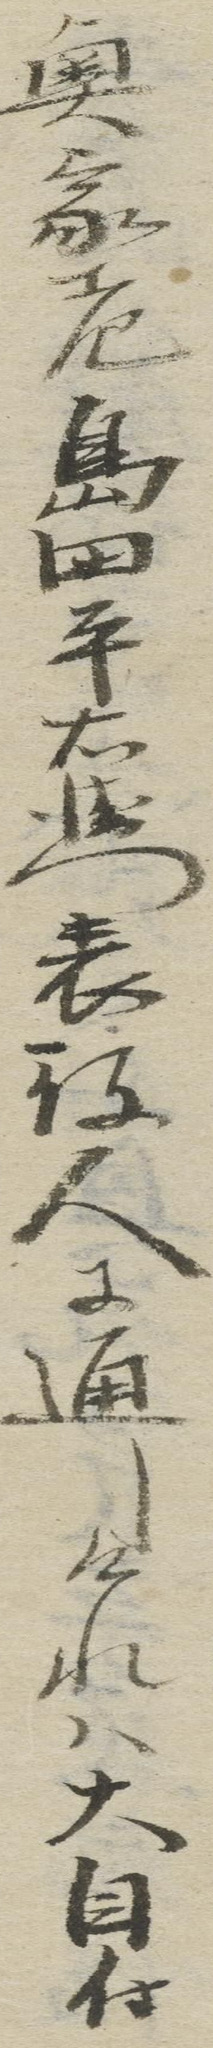奥家老島田平右衛門表役人に通しけれハ大目付
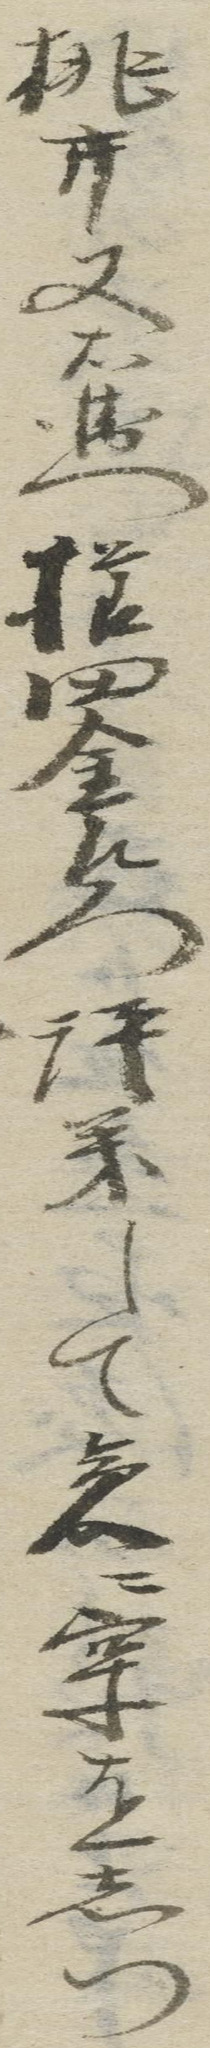桃井又右衛門権田金左衛門評義して爰ニ牢をしつ
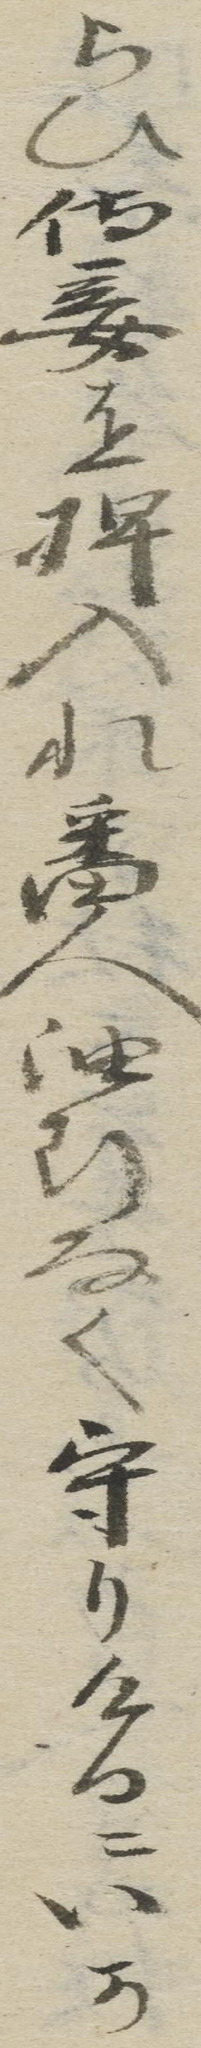らひ侍妾を押入れ番人油断なく守りけるニいか
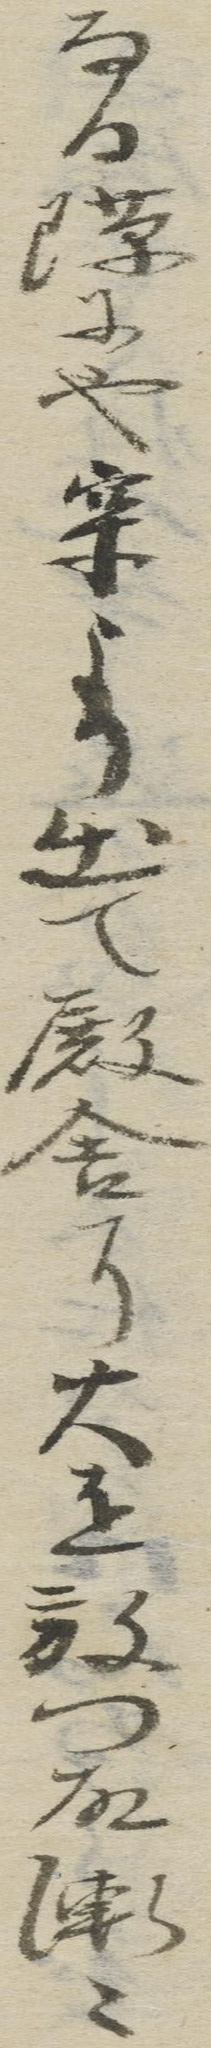るる隙にや牢より出て殿舎に火を放つ故漸〻
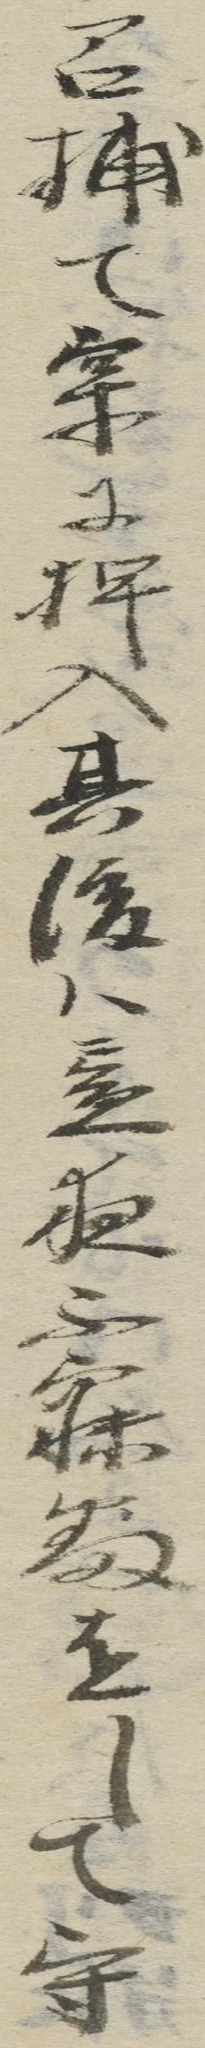召捕て牢に押入其後は昼夜不寝番をして守
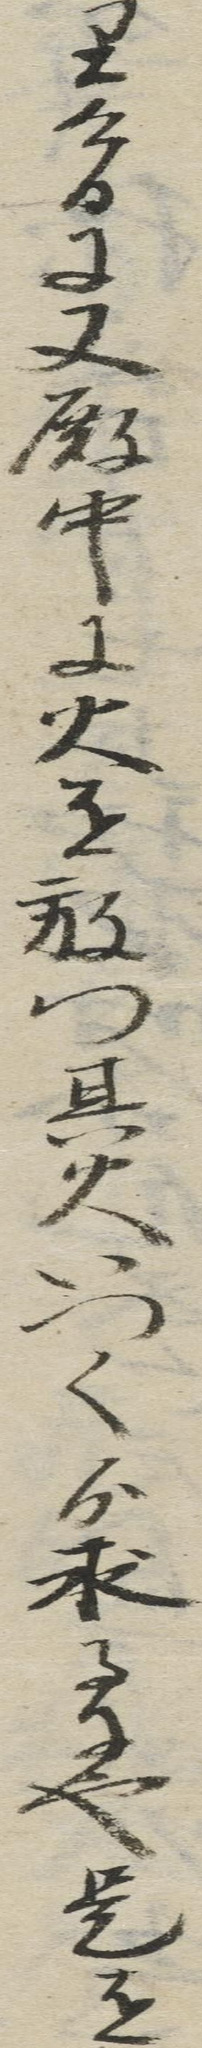りけるに又殿中に火を放つ其火いつくゟ来るにや是を
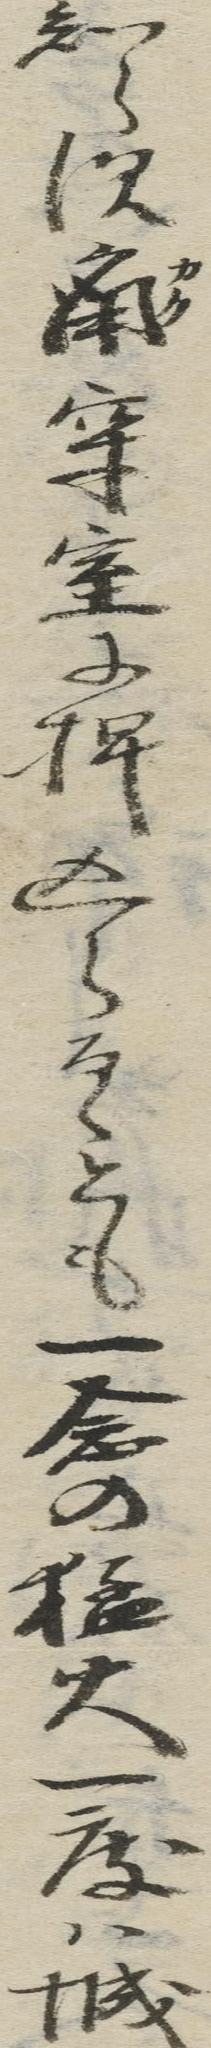知らす角牢室に押込らるゝとも一念の猛火一度ハ城
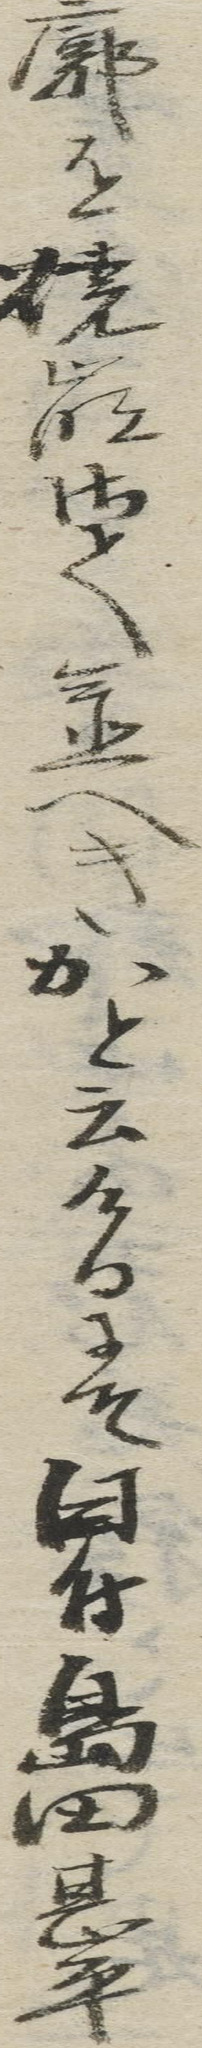郭を焼崩さて置へきかと云けるまて目付島田甚平
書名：肥前國島原領普賢山大変記　完
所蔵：東京大学地震研究所図書室 Earthquake Research Institute Library, The University of Tokyo, JAPAN
